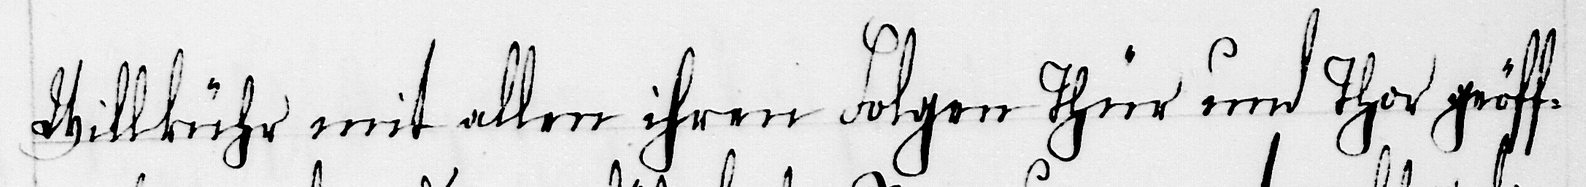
Willkühr mit allen ihren Folgen Thür und Thor geöf¬
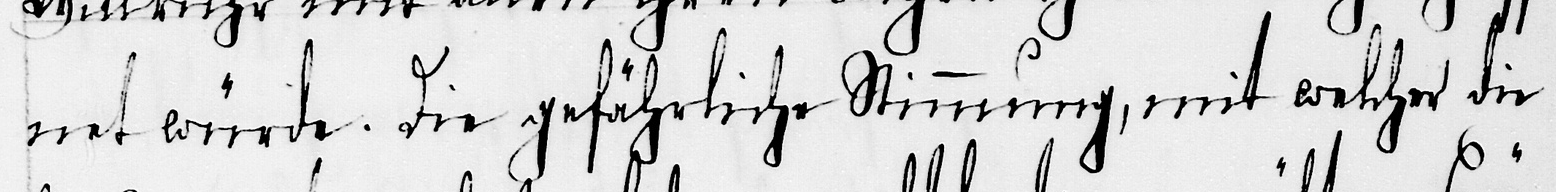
fnet würde. Die gefährliche Stimmung, mit welcher die
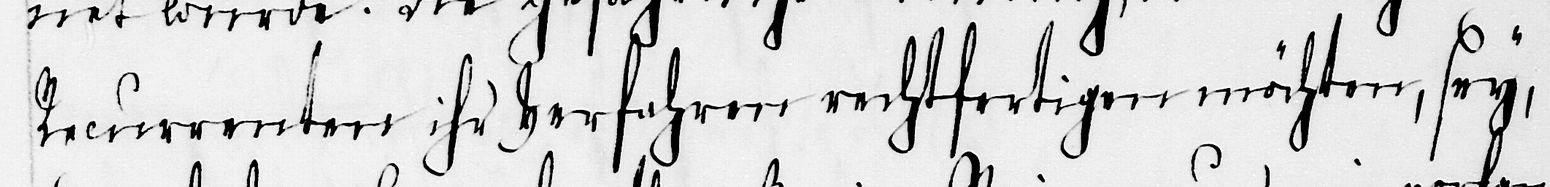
Recurrenten ihr Verfahren rechtfertigen möchten, sey,
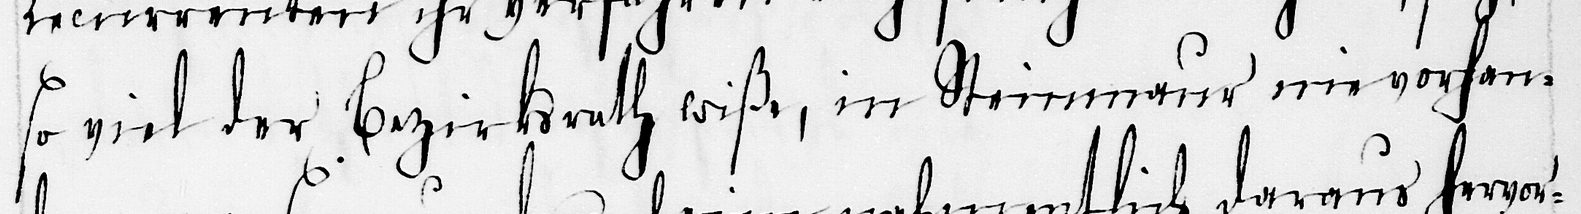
so viel der Bezirksrath wiße, in Steinmaur nie vorhan¬
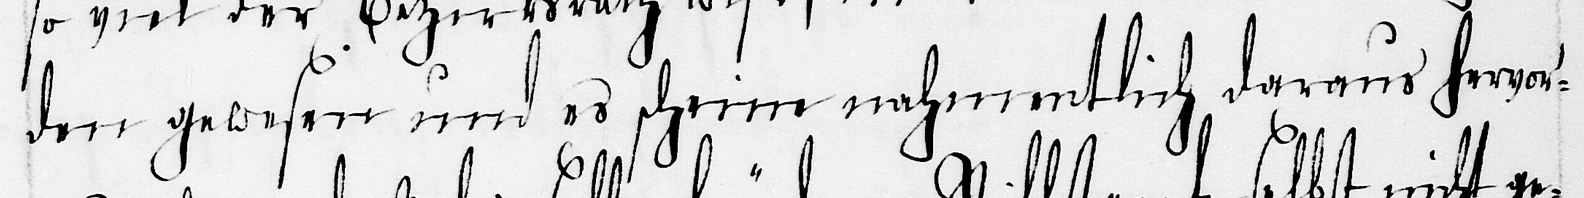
den gewesen und es scheine nahmentlich daraus hervor¬
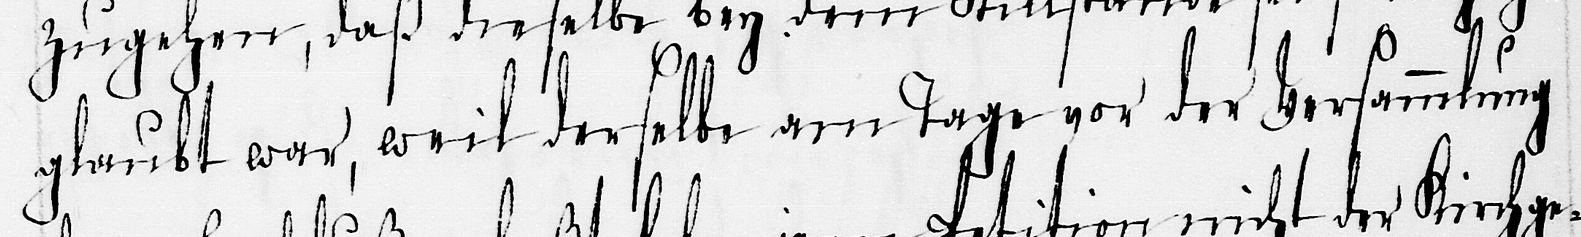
glaubt war, weil derselbe am Tage vor der Versammlung
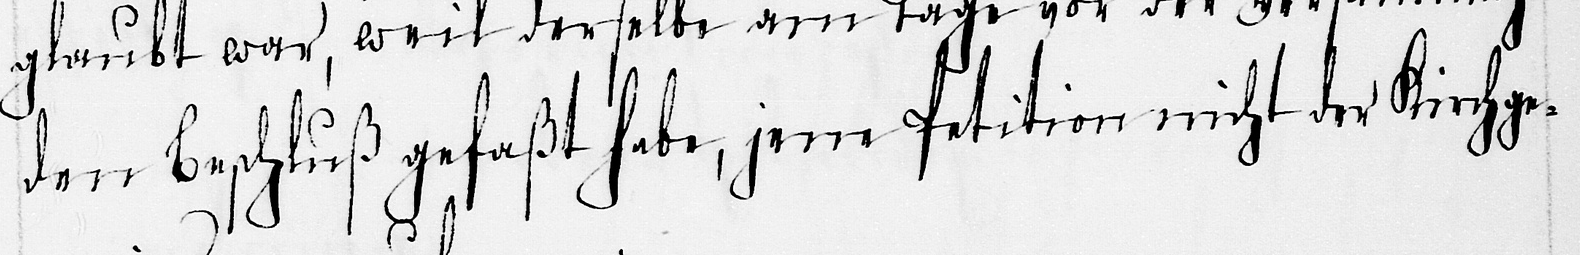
den Beschluß gefaßt habe, jene Petition nicht der Kirchg¬
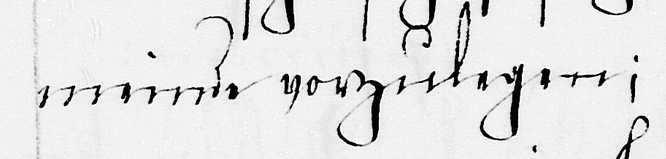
emeinde vorzulegen;
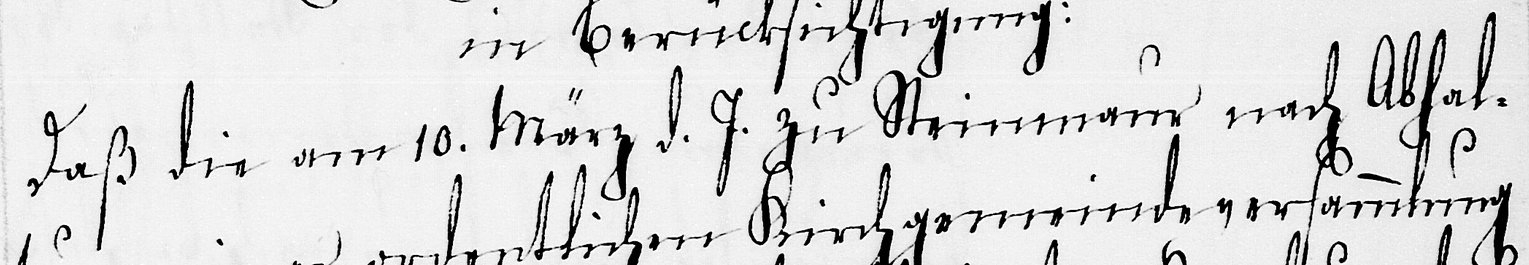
Daß die am 10. März d. J. zu Steinmaur nach Abhal¬
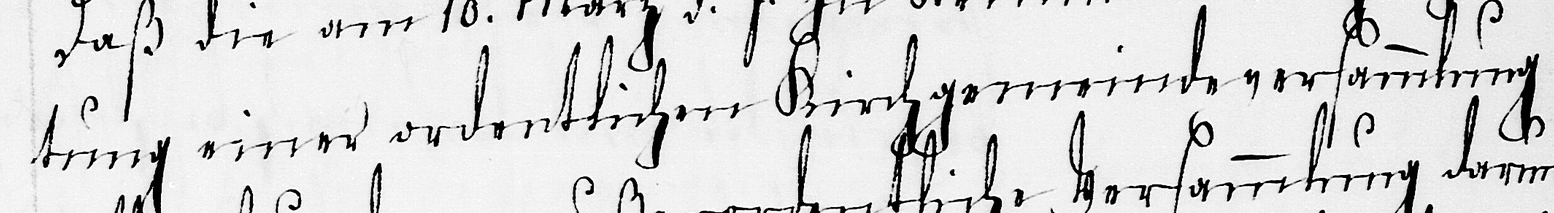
tung einer ordentlichen Kirchgemeindeversammlung
